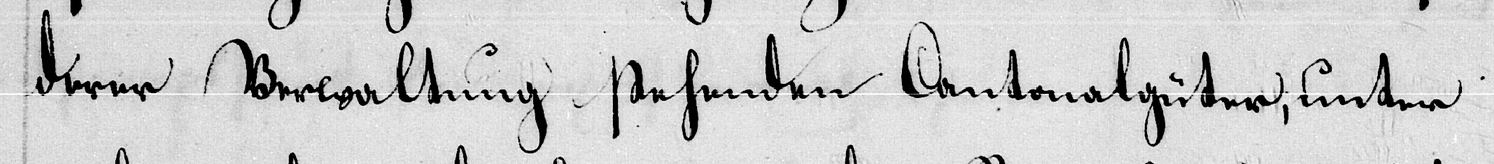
derer Verwaltung stehenden Cantonalgüter, unter
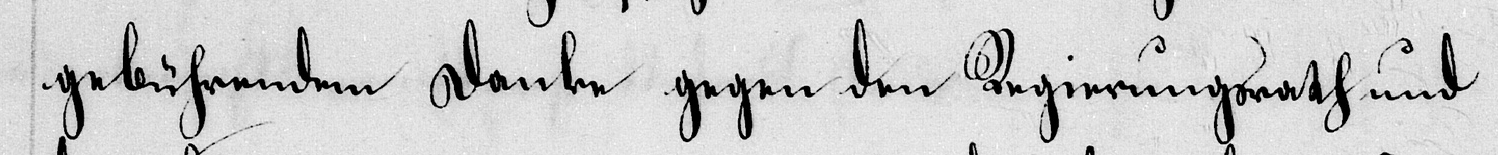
gebührendem Danke gegen den Regierungsrath und
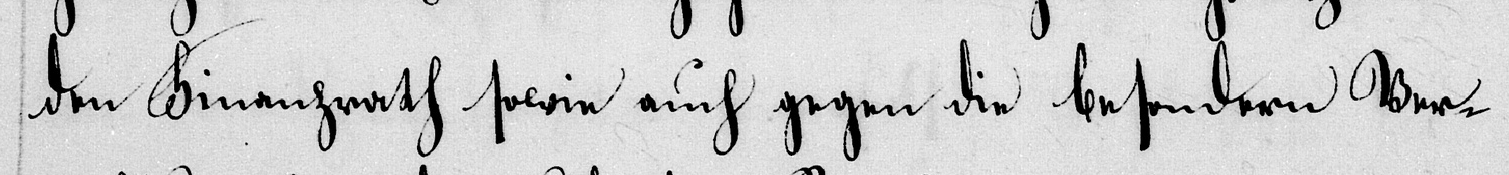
den Finanzrath sowie auch gegen die besondern Ver¬
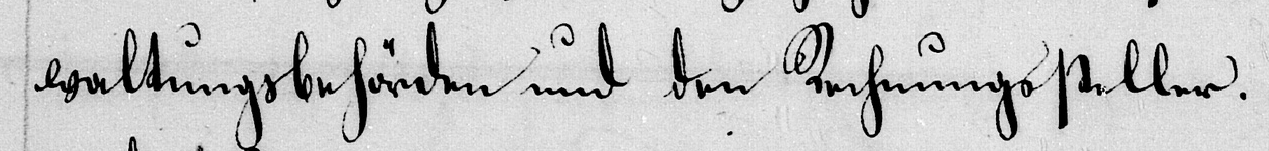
waltungsbehörden und den Rechnungssteller.
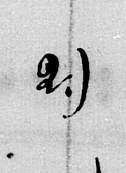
2.)
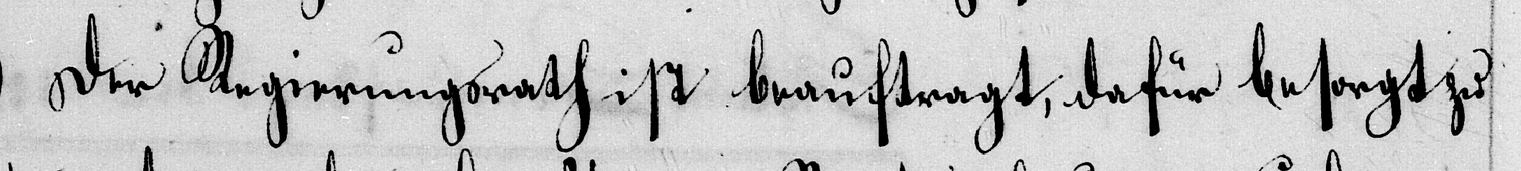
Der Regierungsrath ist beauftragt, dafür besorgt zu
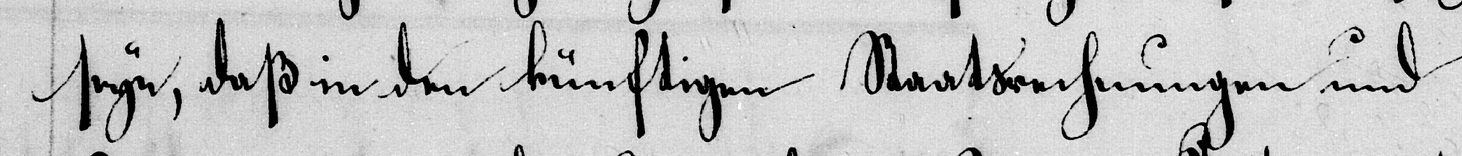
sein, daß in den künftigen Staatsrechnungen und
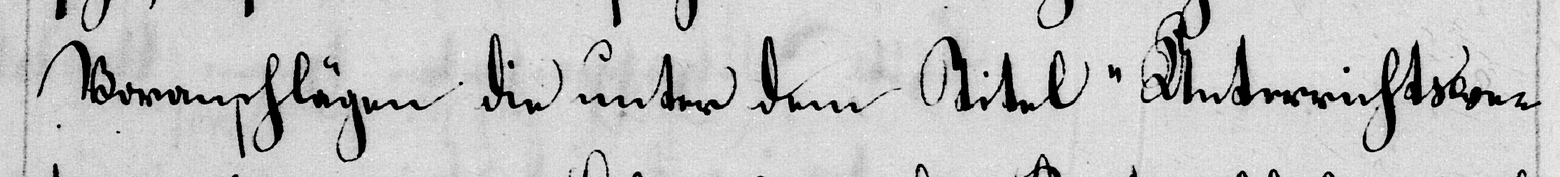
Voranschlägen die unter dem Titel „Unterrichtswe¬
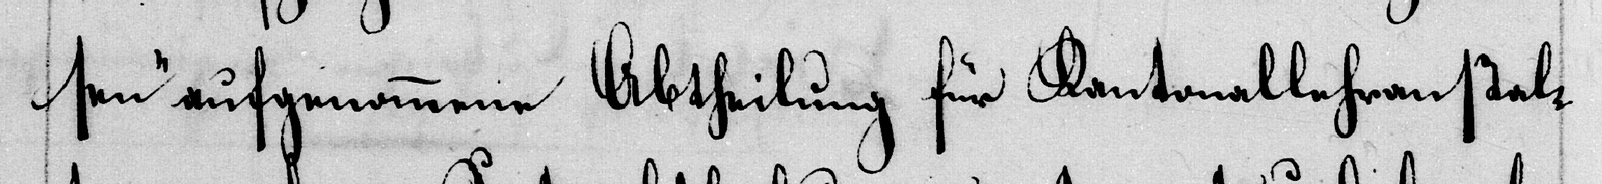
sen“ aufgenommene Abtheilung für Kantonallehranstal¬
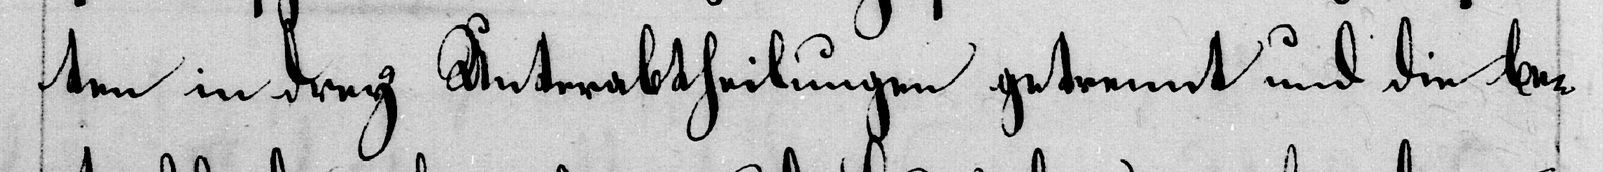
ten in drey Unterabtheilungen getrennt und die be¬
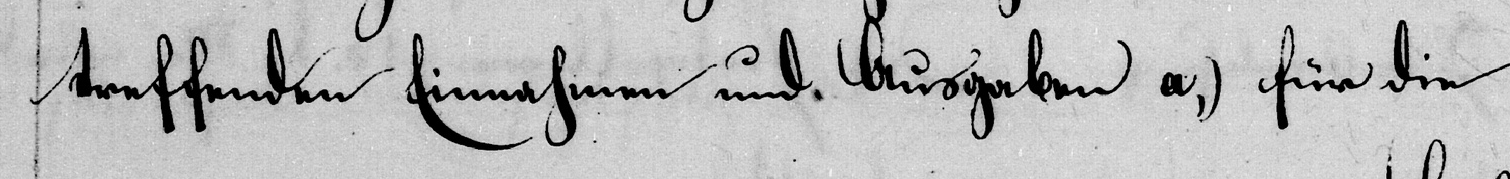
treffenden Einnahmen und Ausgaben a,) für die
